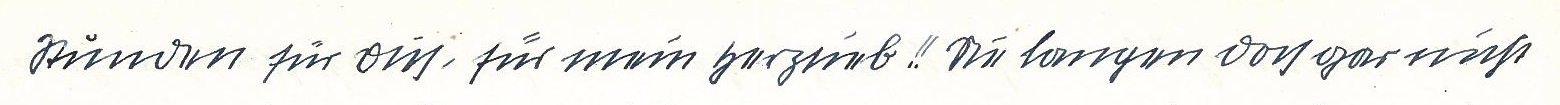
Stunden für Dich, für mein Herzlieb!! Sie langen doch gar nicht
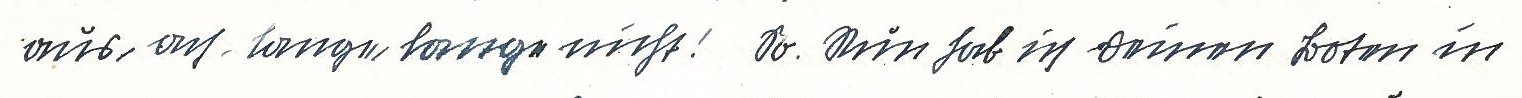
aus, ach, lange, lange nicht! So. Nun hab ich Deinen Boten in
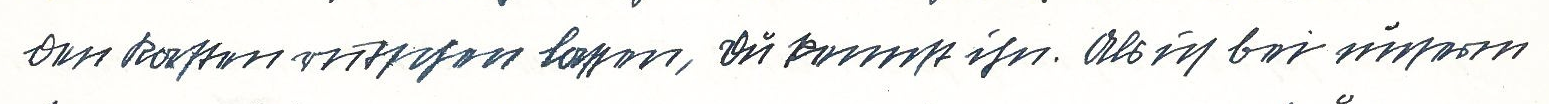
den Kasten rutschen lassen, Du kennst ihn. Als ich bei unserem
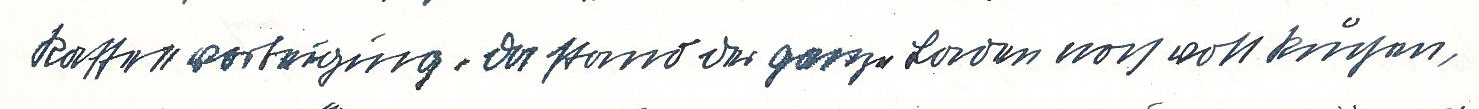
Kaffee vorbeiging, da stand der ganze Laden noch voll Kuchen,
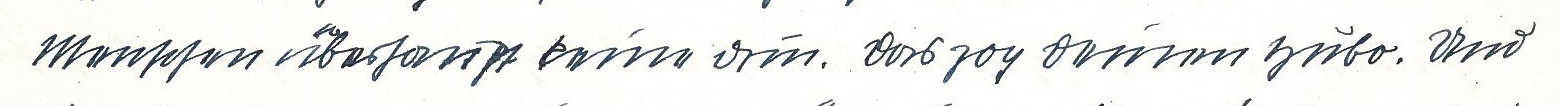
Menschen überhaupt keine drin. Das zog Deinen Hubo. Und
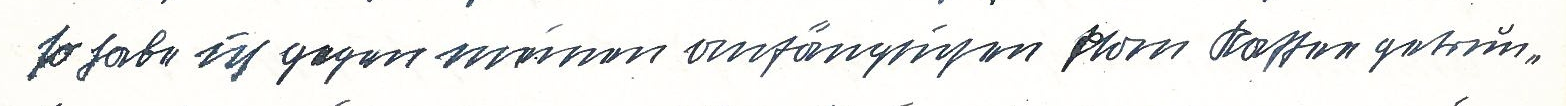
so habe ich gegen meinen anfänglichen Plan Kaffee getrun¬
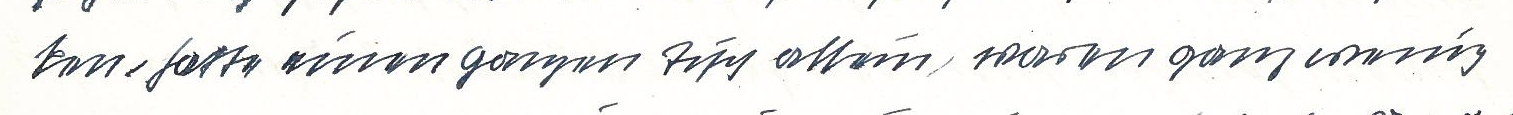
ken, hatte einen ganzen Tisch allein, waren ganz wenig
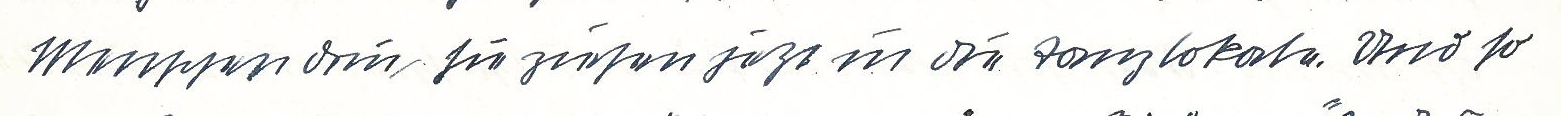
Menschen drin, sie ziehen jetzt in die Tanzlokale. Und so
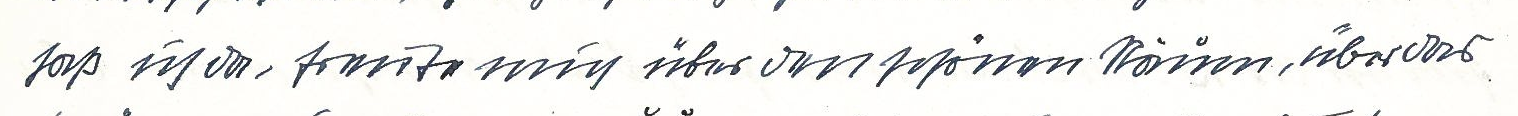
saß ich da, freute mich über den schönen Raum, über das
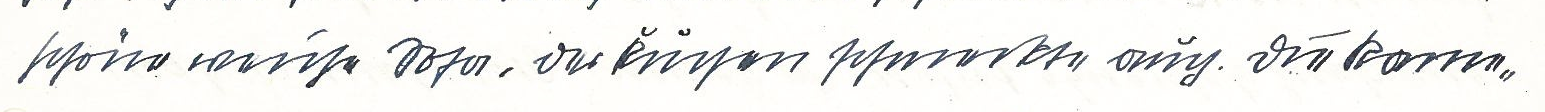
schöne weiche Sofa, der Kuchen schmeckte auch. Die Kame¬
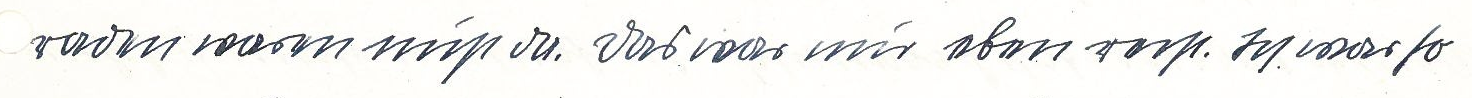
raden waren nicht da. Das war mir eben recht. Ich war so
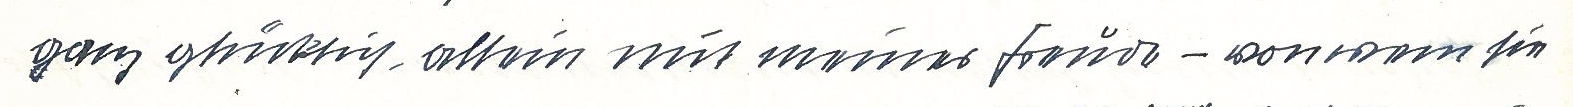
ganz glücklich, allein mit meiner Freude – von wem sie
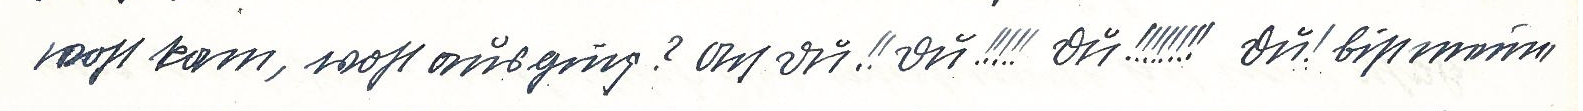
wohl kam, wohl ausging? Ach Du!! Du!!!!! Du!!!!!!!! Du! Bist meine
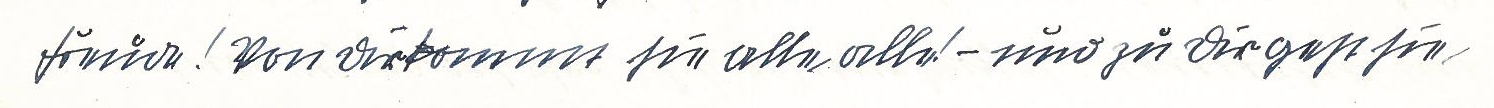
Freude! Von Dir kommt sie alle, alle! – und zu Dir geht sie,
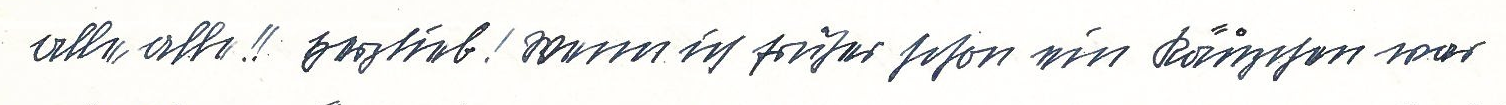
alle, alle!! Herzlieb! Wenn ich früher schon Käuzchen war
